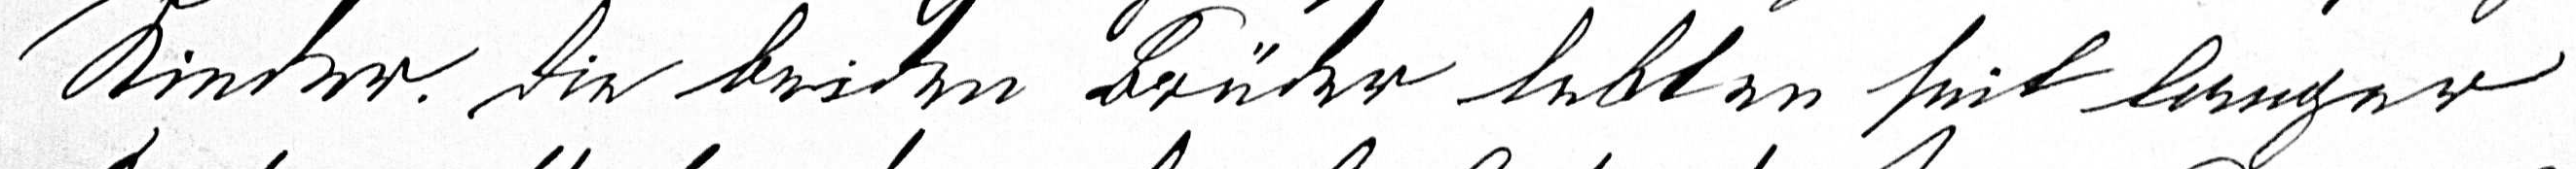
Kinder. Die beiden Brüder lebten seit langer
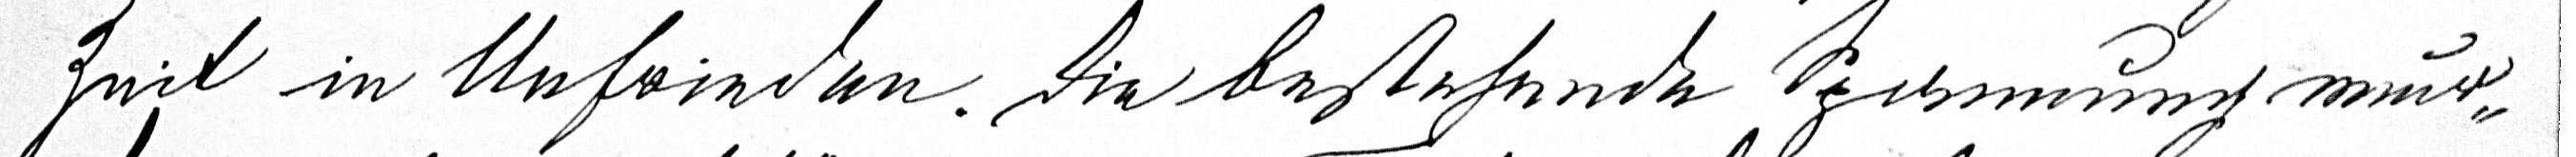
Zeit in Unfrieden. Die bestehende Spannung wur¬
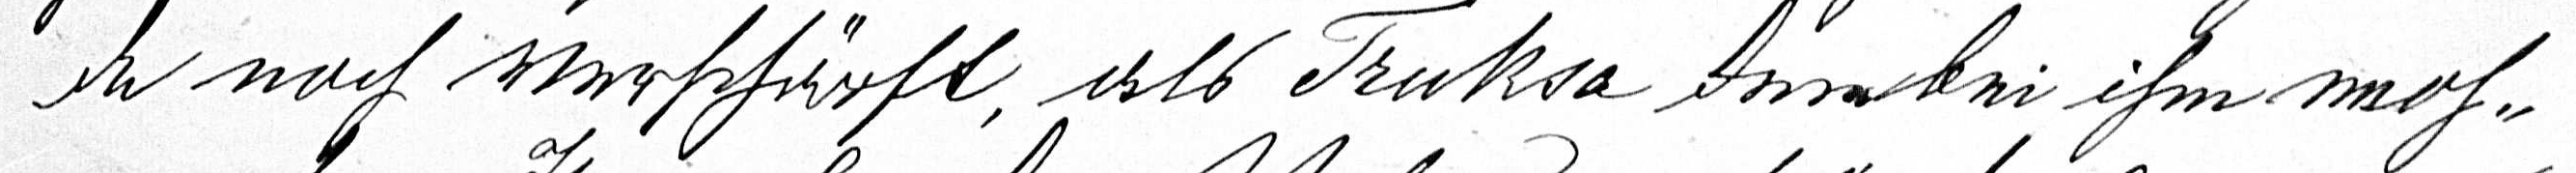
de noch verschärft, als Truksa dem bei ihm woh¬
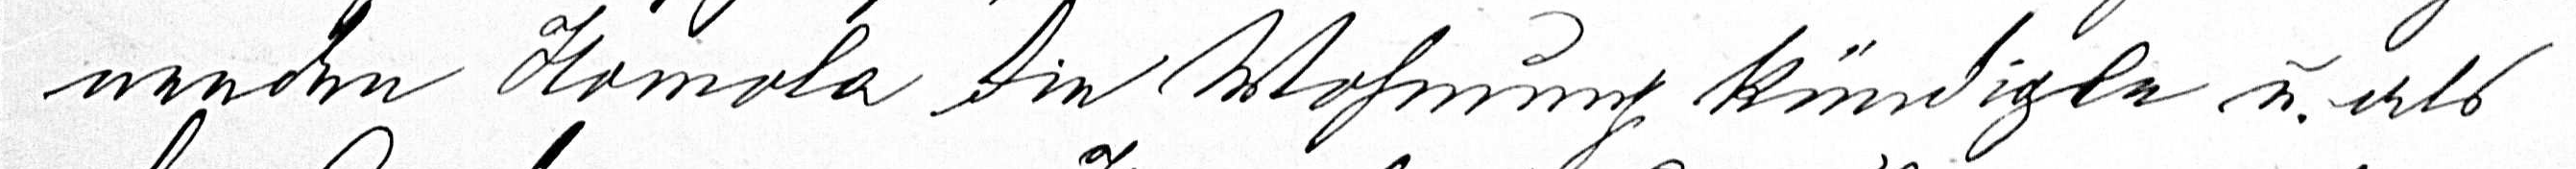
nende Homola die Wohnung kündigte u. als
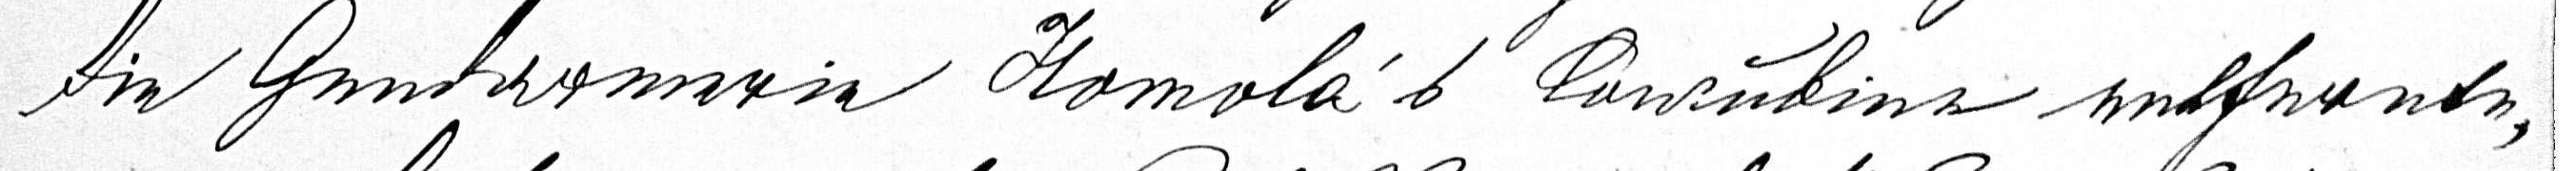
die Gendarmerie Homola’s Concubine entfernte,
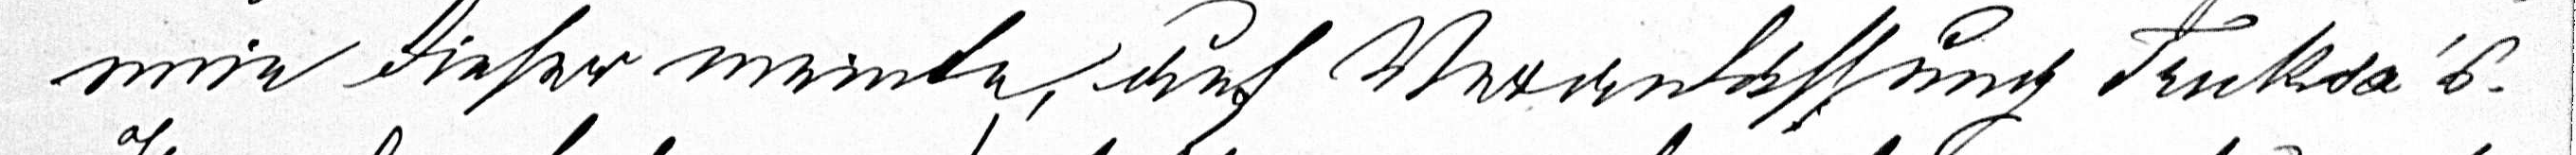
wie dieser weinte, auf Veranlassung Truksa’s.
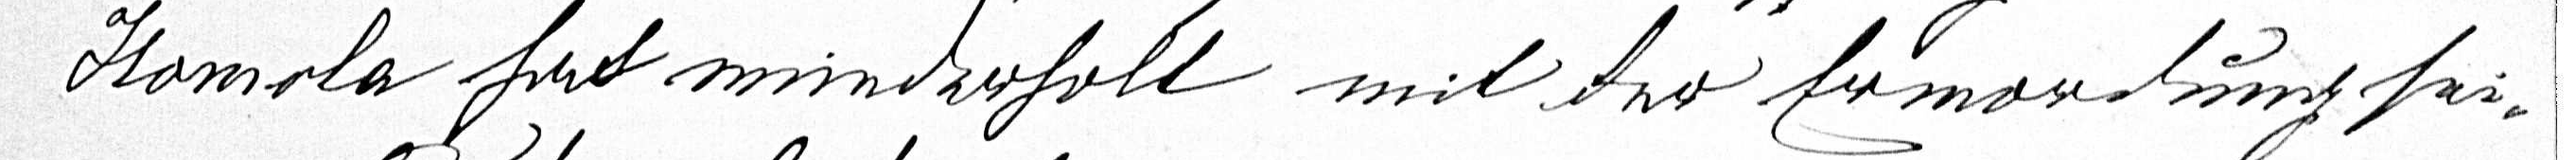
Homola hat wiederholt mit der Ermordung sei¬
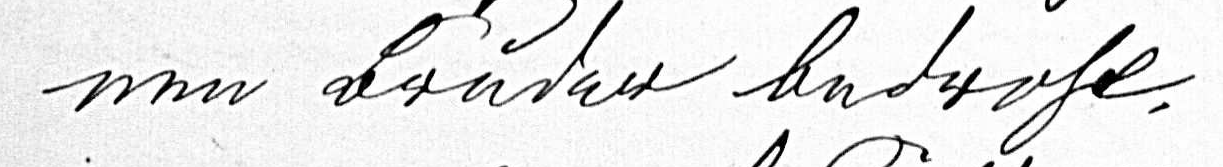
nen Bruder bedroht.
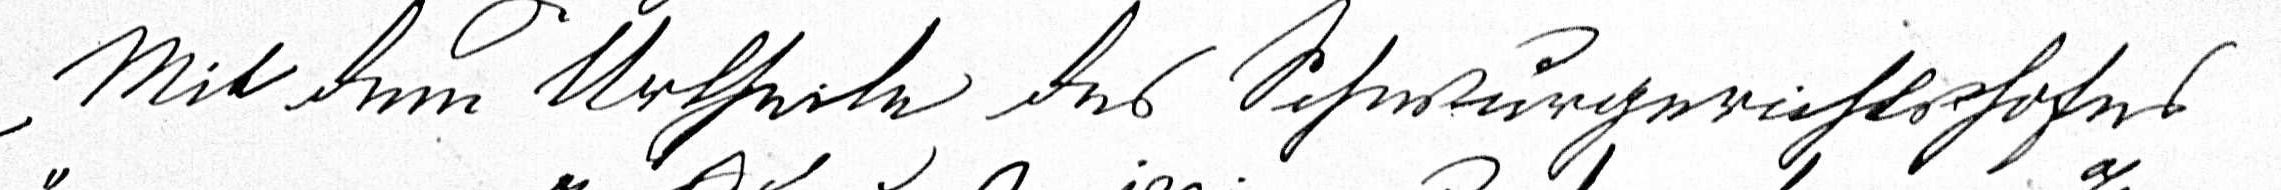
Mit dem Urtheile des Schwurgerichtshofes
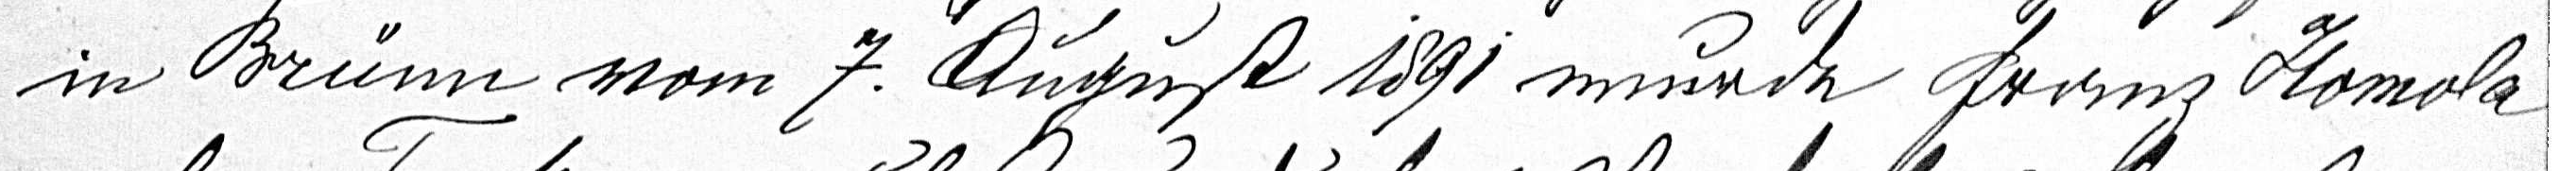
in Brünn vom 7. August 1891 wurde Franz Homola
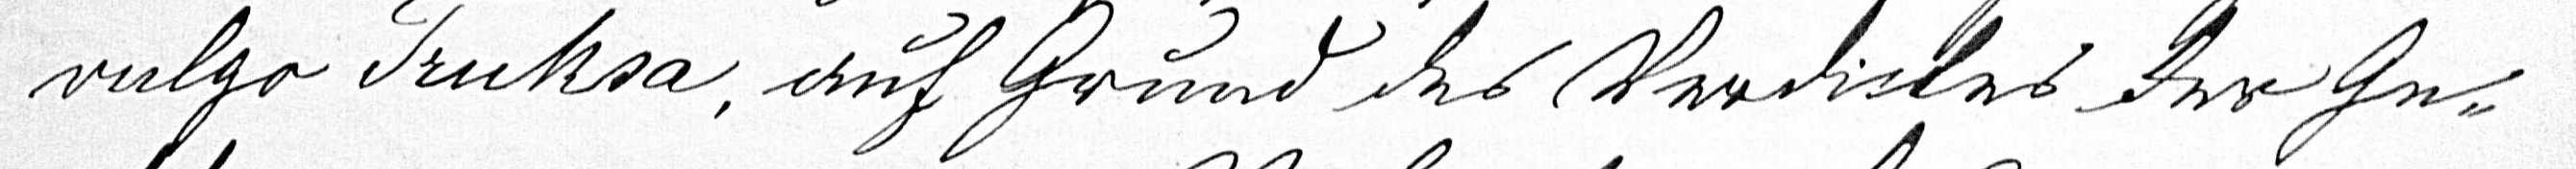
vulgo Truksa auf Grund des Verdictes der Ge¬
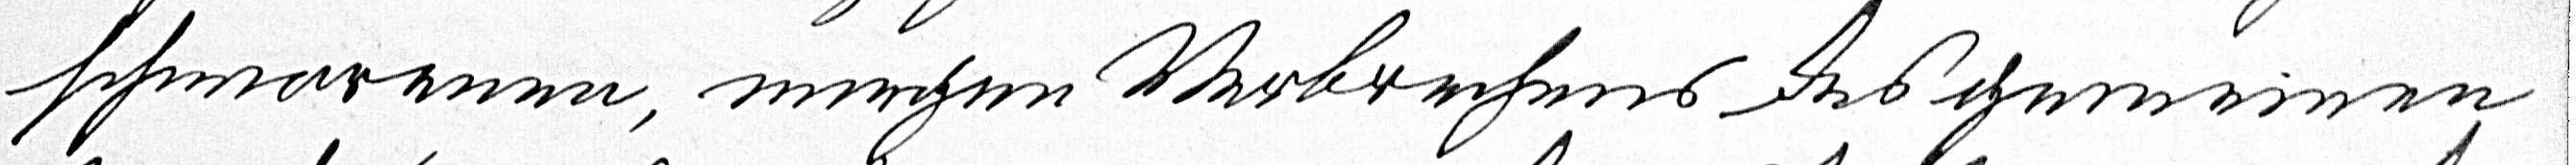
schworenen, wegen Verbrechens des gemeinen
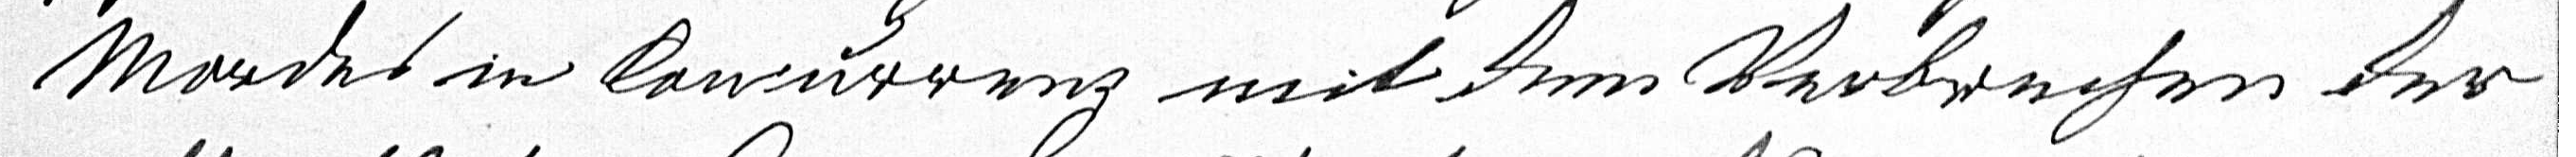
Mordes in Concurrenz mit dem Verbrechen der
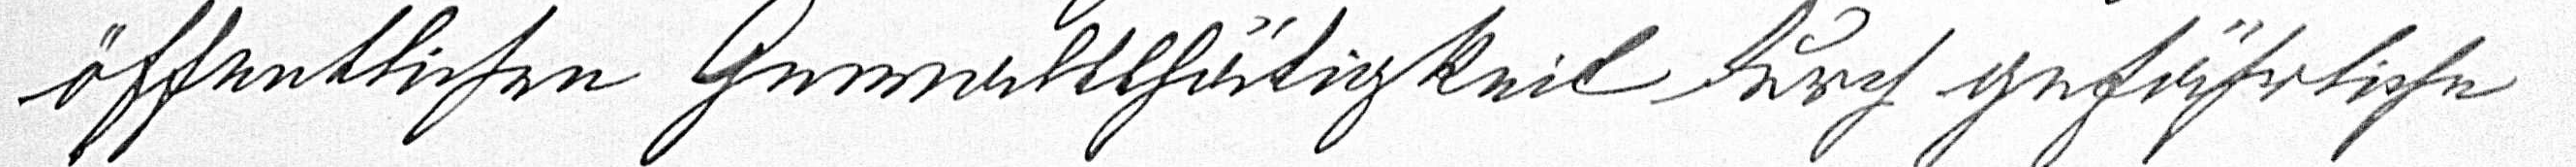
öffentlichen Gewaltthätigkeit durch gefährliche
